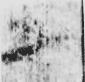之
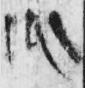州
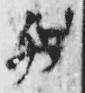加
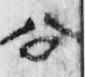公
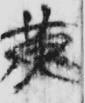黃
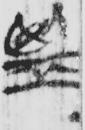監
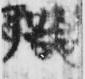○（噩）
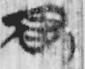君
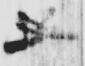之
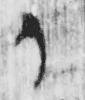人
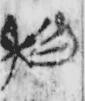利（利）
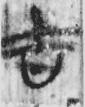吉
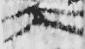大
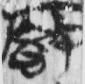○（厩）
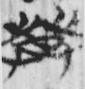登
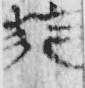荇
